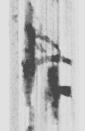之
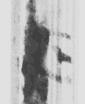亦
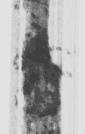亓
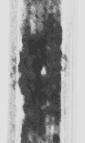希
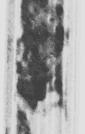今
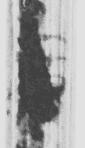貴
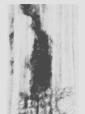人
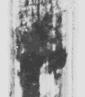㠯（以）
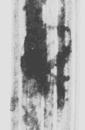色
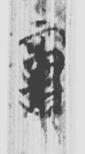{畐貝}
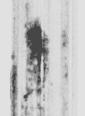人
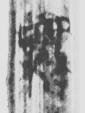無
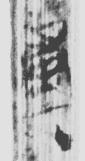量
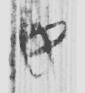女
